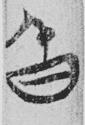昏（問）
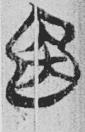因
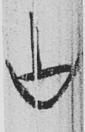由
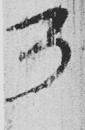乃
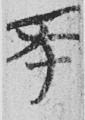不
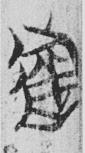○（失）
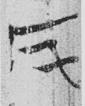厇（度）
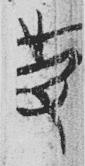皮（彼）
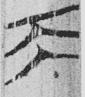天
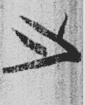之
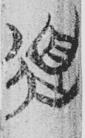道
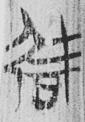唯
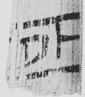亙
